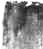八
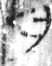月
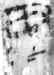○（建）
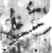於
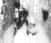申
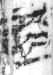○（陷）
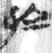於
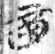梄（酉）
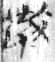○（破）
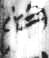於
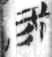戌
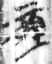坪（平）
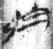於
